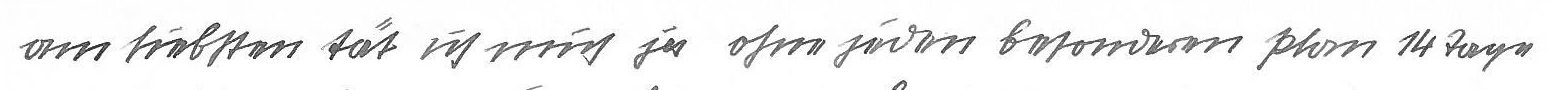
am liebsten tät ich mich ja ohne jeden besonderen Plan 14 Tage
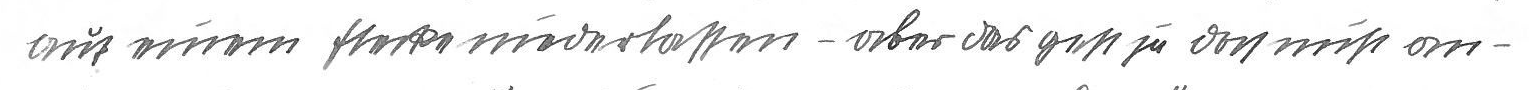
auf einem Flecke niederlassen – aber das geht ja doch nicht an –
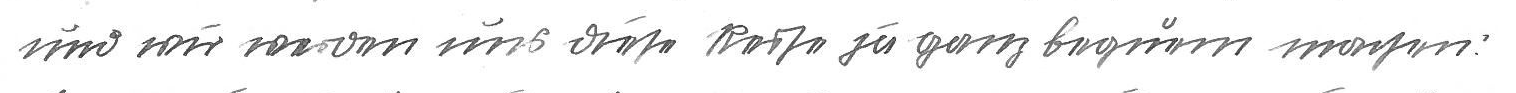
und wir werden uns diese Reise ja ganz bequem machen:
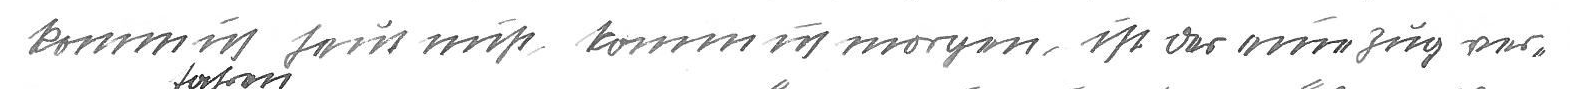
Komm ich heut nicht, komm ich morgen, ist der eine Zug ver¬
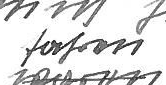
fahren
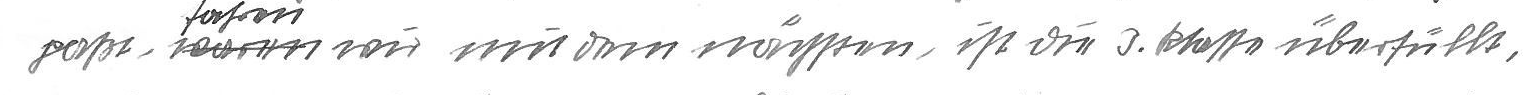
paßt, waren wir mit dem nächsten, ist die 3. Klasse überfüllt,
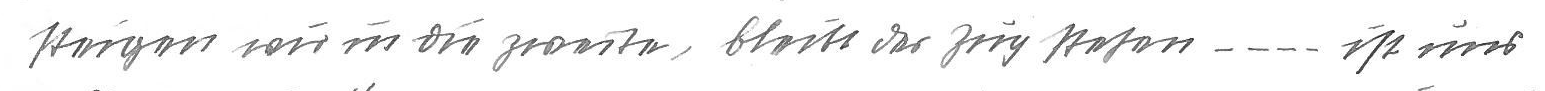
steigen wir in die zweite, bleibt der Zug stehen – – – – ist uns
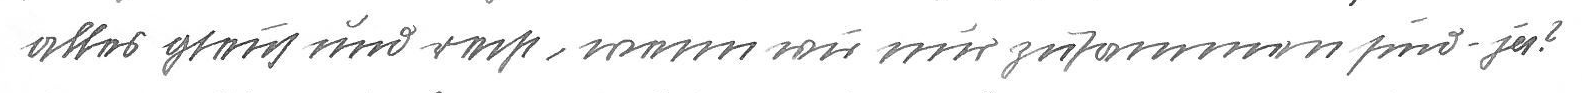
alles gleich und recht, wenn wir nur zusammen sind – ja?
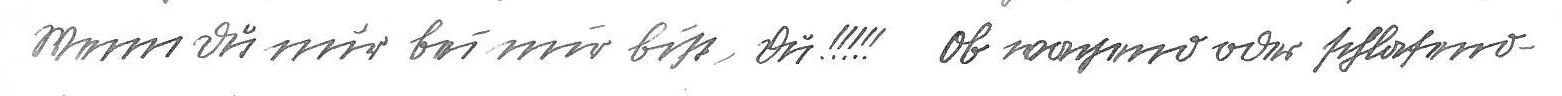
Wenn Du nur bei mir bist, Du!!!!! Ob wachend oder schlafend –
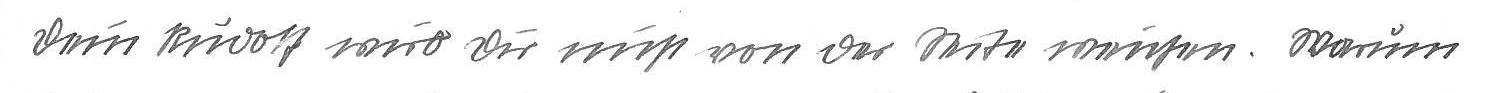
Dein wird Dir nicht von der Seite weichen. Warum
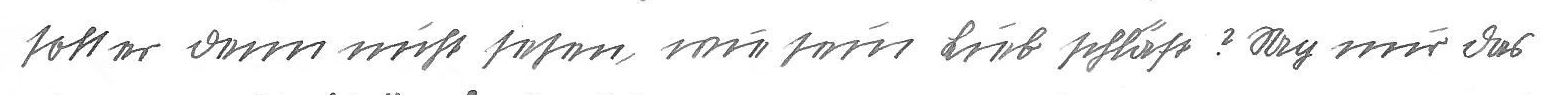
soll er denn nicht sehen, wie sein Lieb schläft? Sag mir das
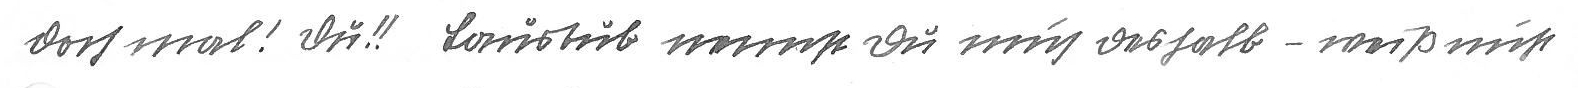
doch mal! Du!! Lausbub nennst Du mich deshalb – weißt nicht
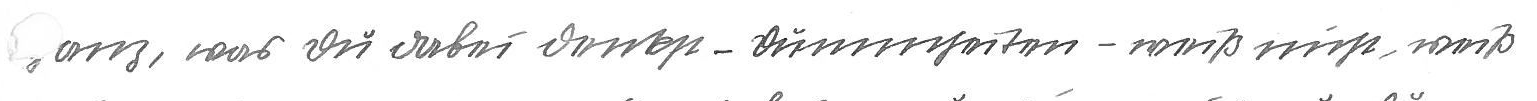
anz, was Du dabei denkst – Dummheiten – weiß nicht, weiß
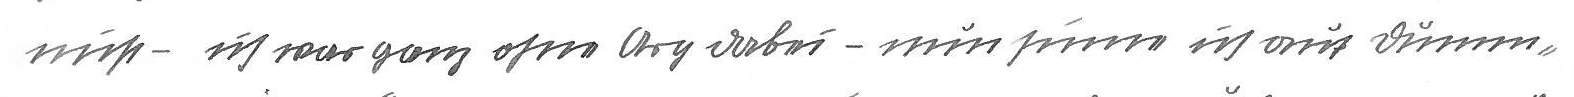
nicht – ich war ganz ohne Arg dabei – nun sinne ich auf Dumm¬
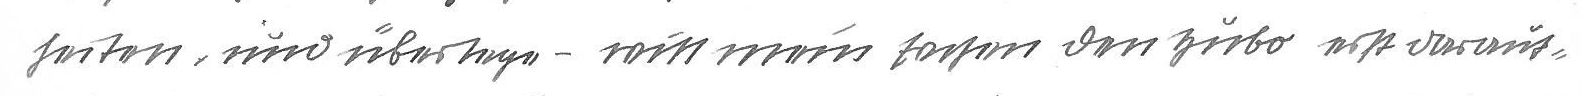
heiten, und überlege – will mein Evchen den Hubo erst darauf¬
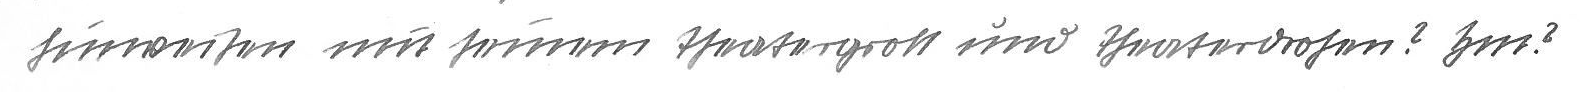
hinweisen mit seinem Theatergroll und Theaterdrohen? Hm?
